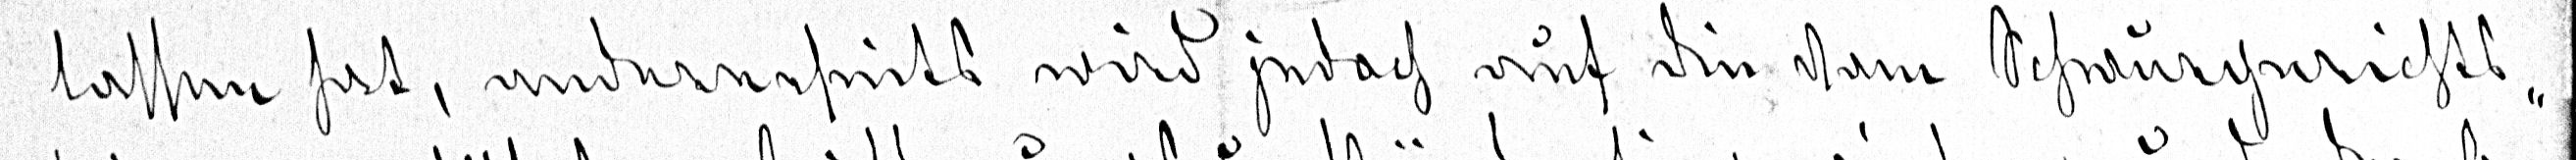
lassen hat, andererseits wird jedoch auf die vom Schwurgerichts¬
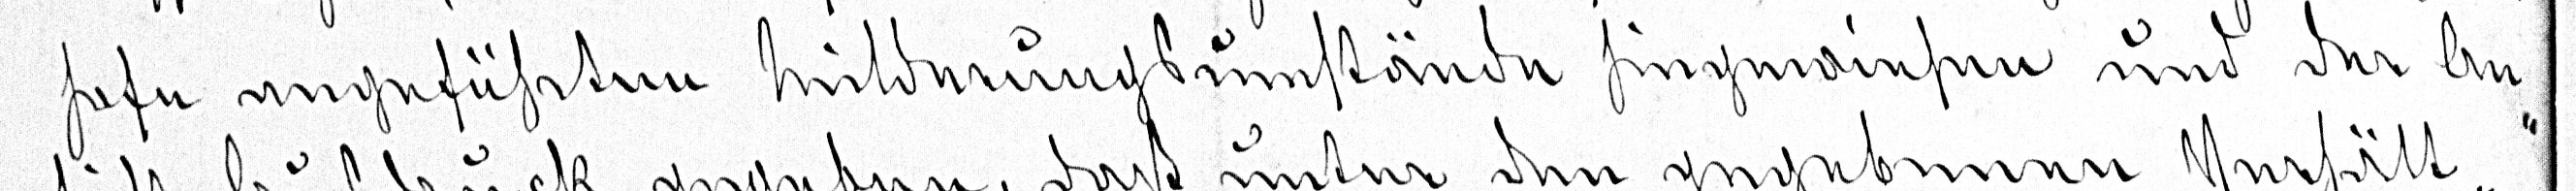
hofe angeführten Milderungsumstände hingewiesen und der An¬
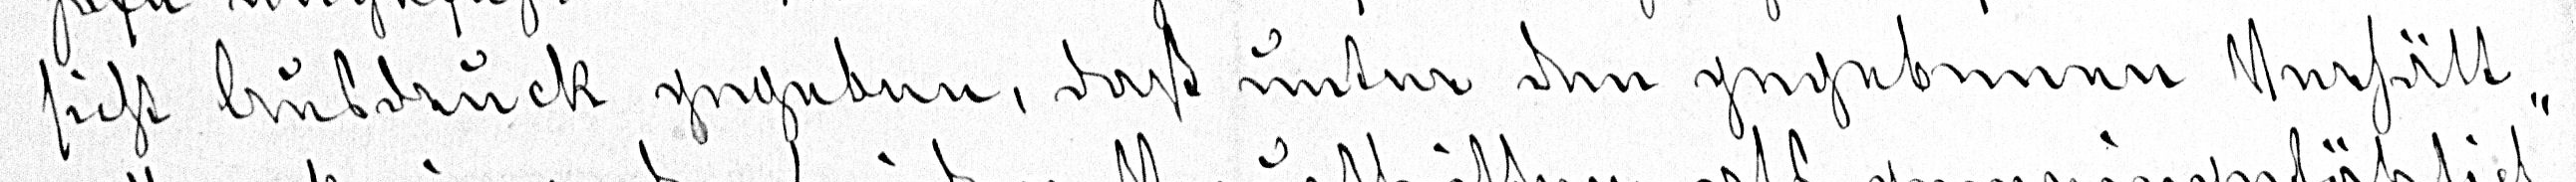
sicht Ausdruck gegeben, daß unter den gegebenen Verhält¬
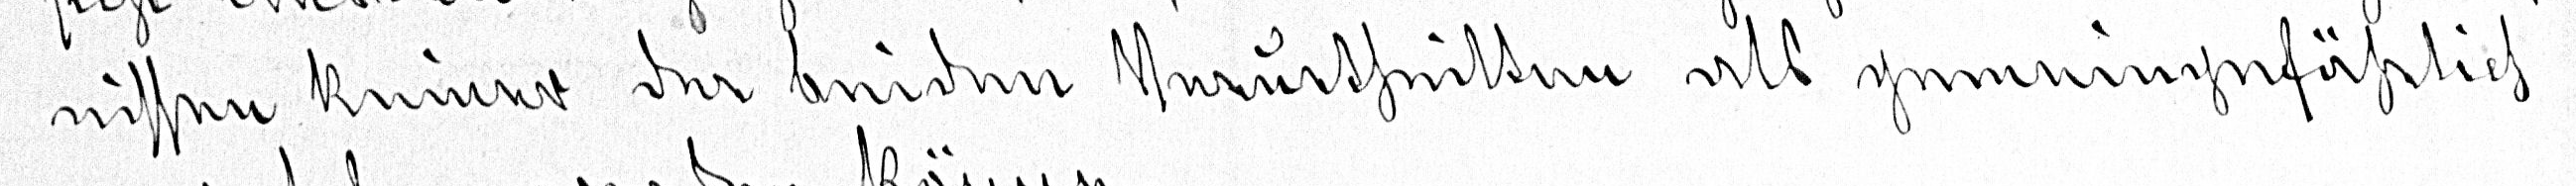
nissen keiner der beiden Verurtheilten als gemeingefährlich
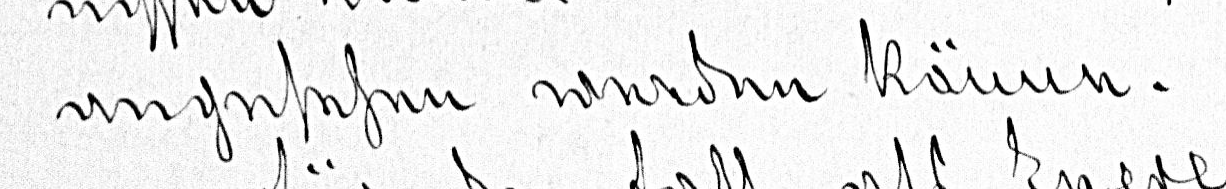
angesehen werden könne.
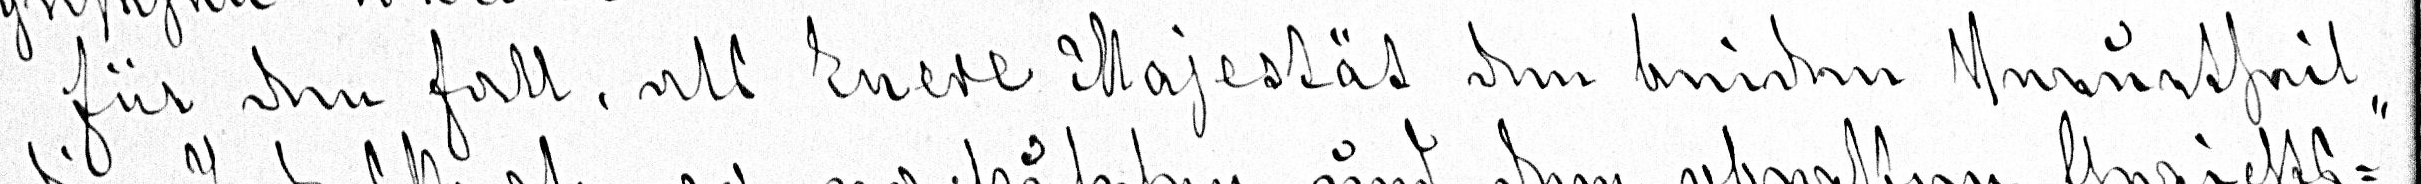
Für den Fall, als Euere Majestät den beiden Verurtheil¬
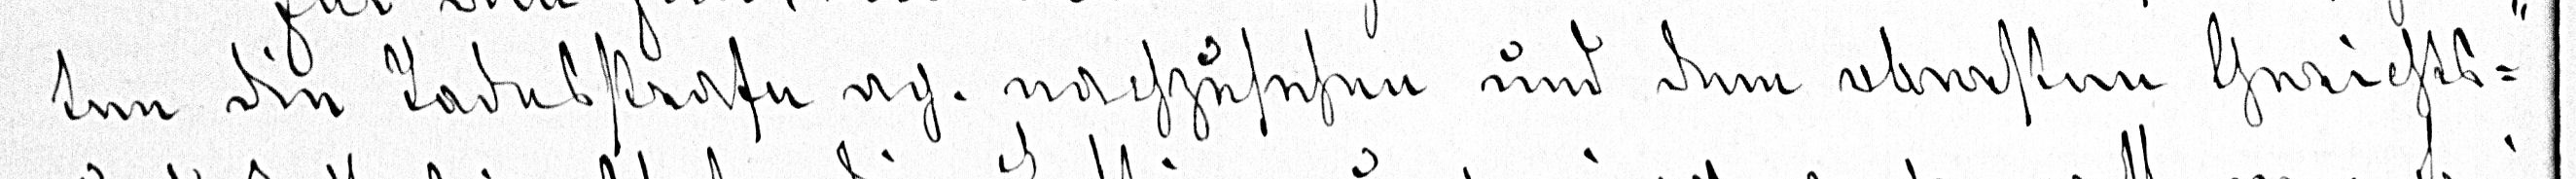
ten die Todesstrafe ag. nachzusehen und dem obersten Gerichts¬
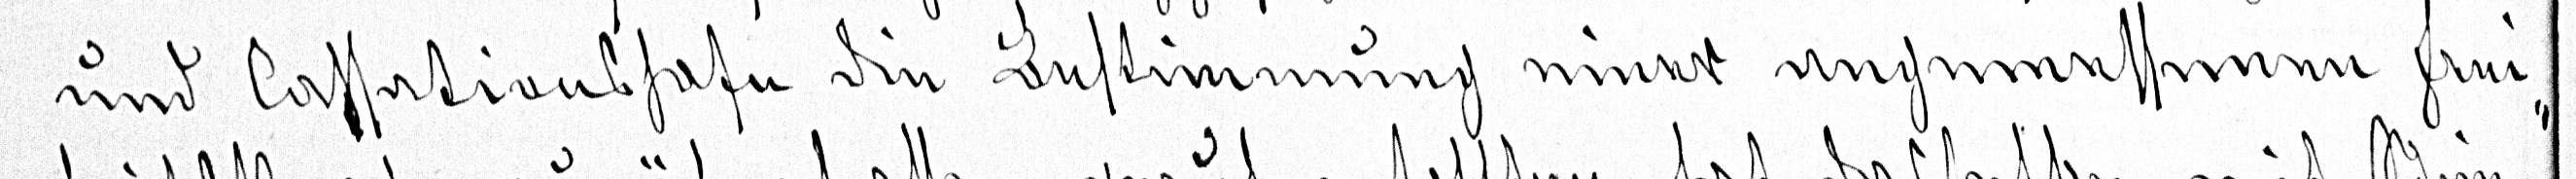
und Cassationshofe die Bestimmung einer angemessenen Frei¬
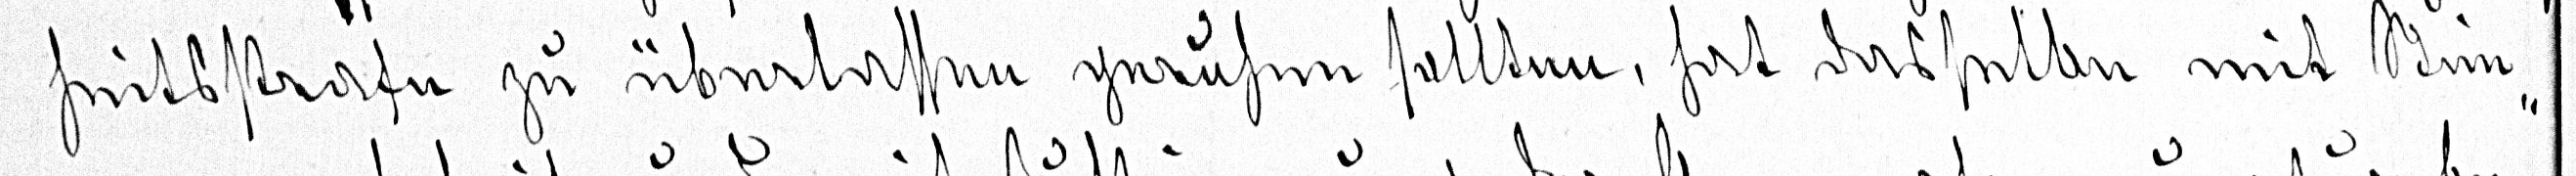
heitsstrafe zu überlassen geruhen sollten, hat dasselbe mit Stim¬
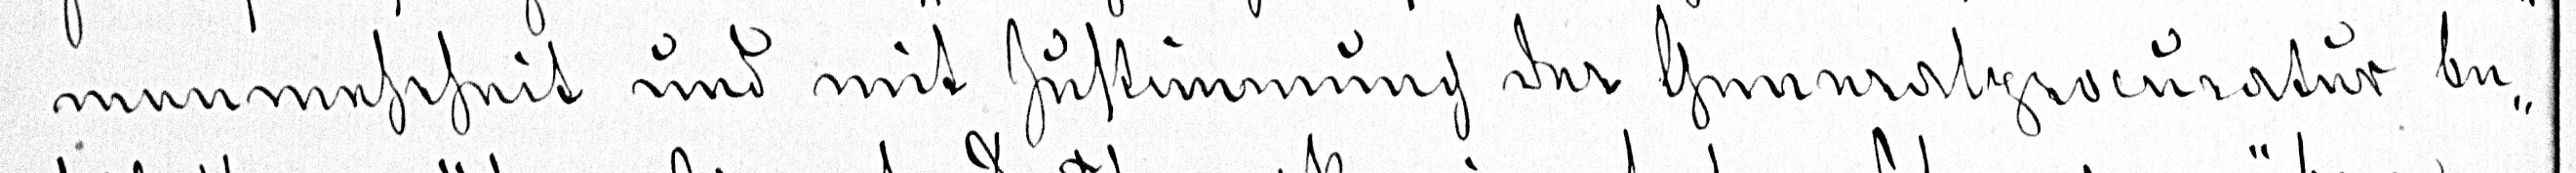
menmehrheit und mit Zustimmung der Generalprocuratur be¬
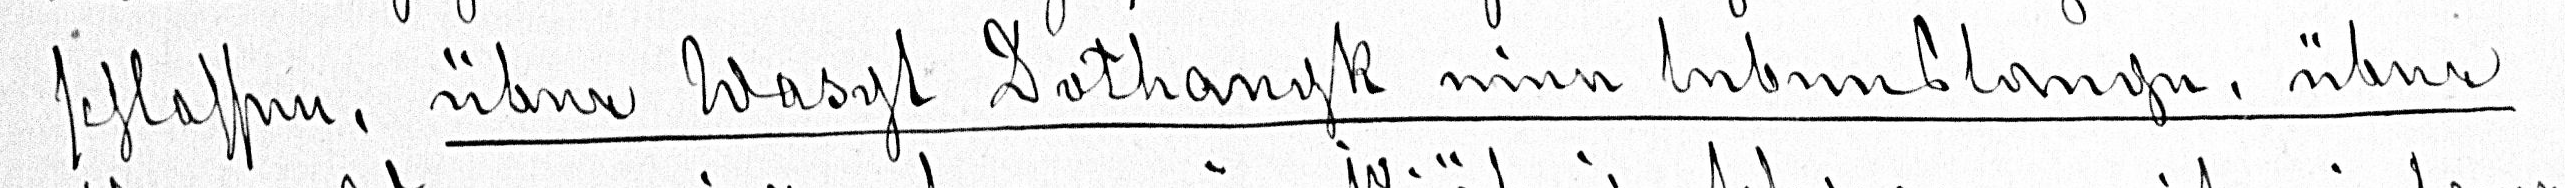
schlossen, über Wasyl Dothanyk eine lebenslange, über
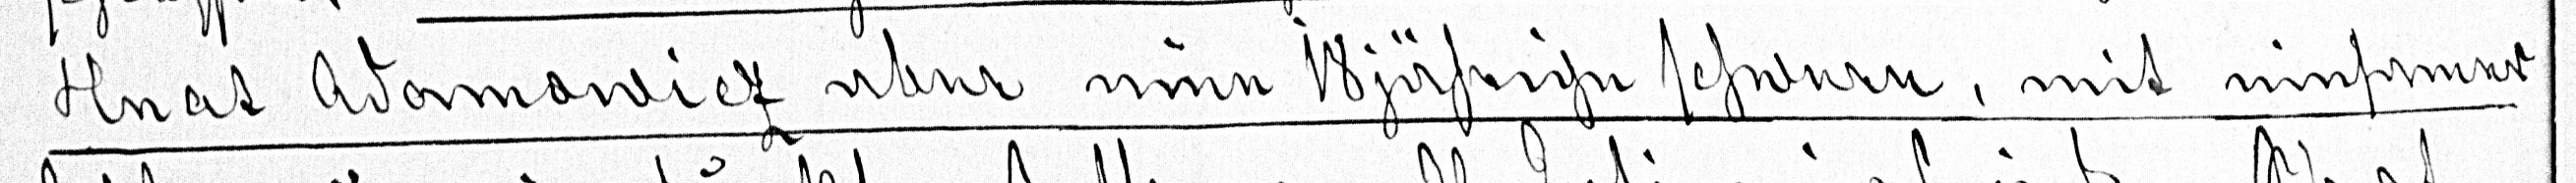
Hnat Adamowicz aber eine 18jährige schwere, mit einsamer
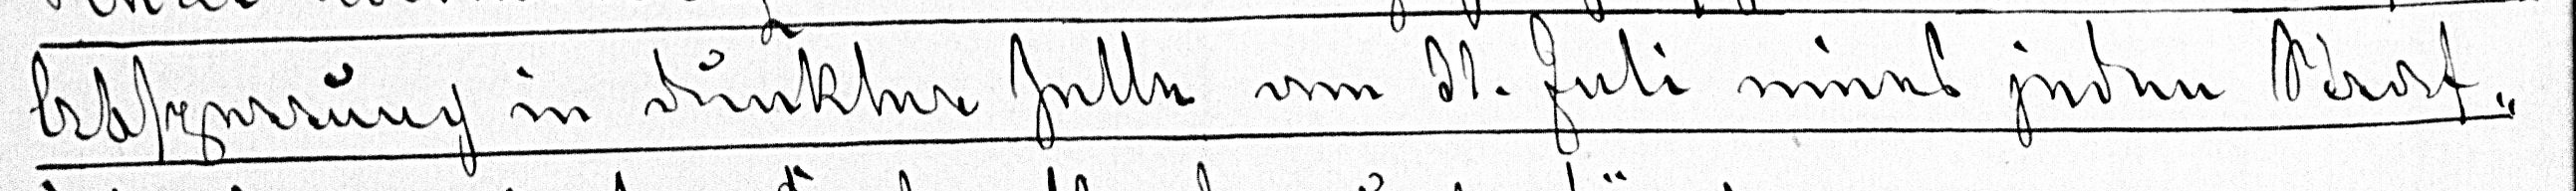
Absperrung in Dunkler Zelle am 31. Juli eines jeden Straf¬
